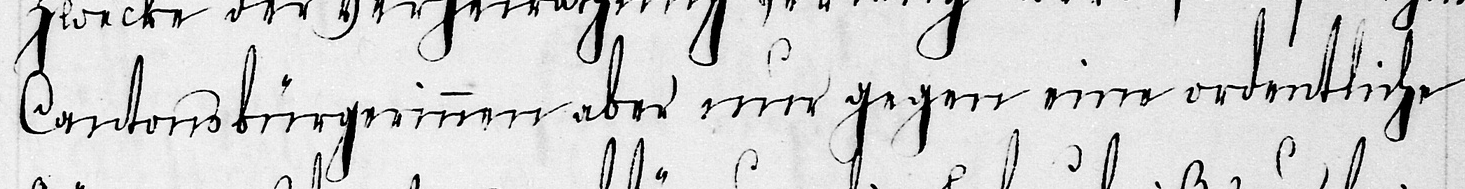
Cantonsbürgerinnen aber nur gegen eine ordentliche
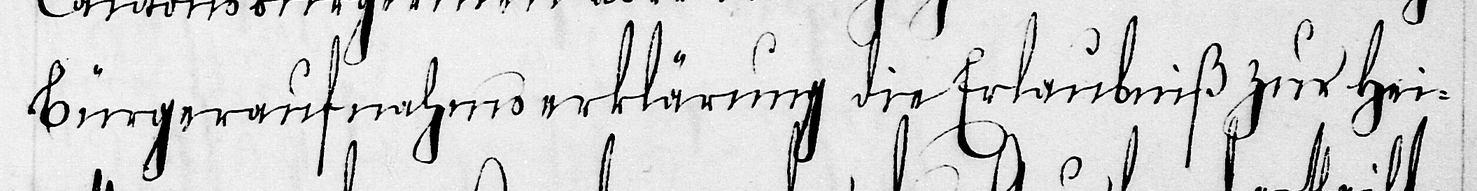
Bürgeraufnahmserklärung die Erlaubniß zur Hei¬
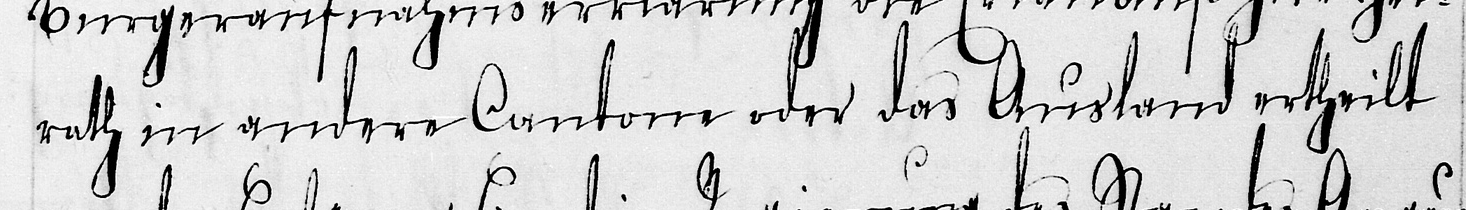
rath in andere Cantone oder das Ausland ertheilt
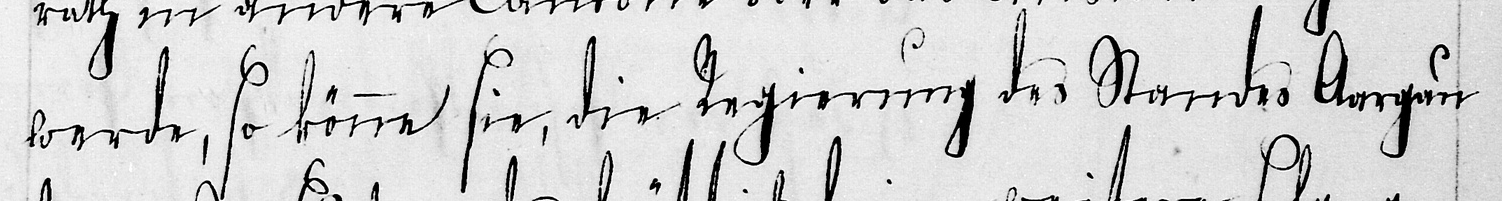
werde, so könne sie, die Regierung des Standes Aargau
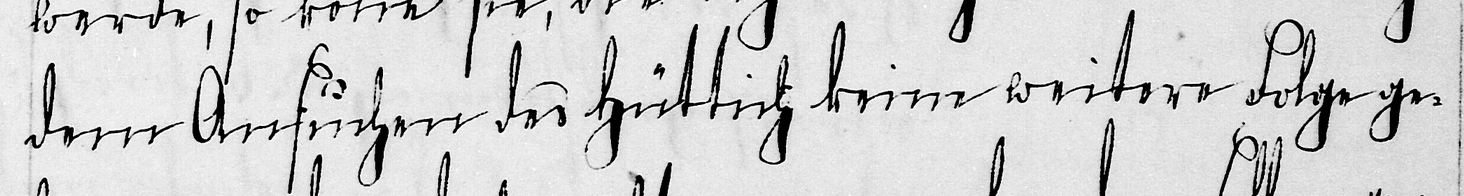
dem Ansuchen des Hüttich keine weitere Folge ge¬
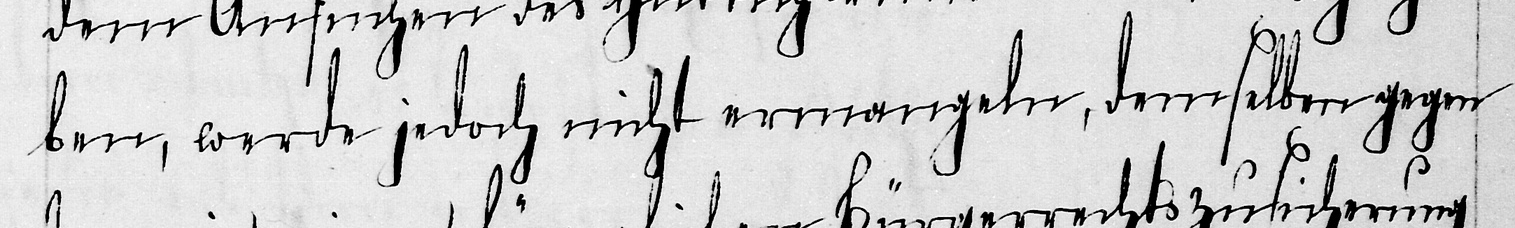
ben, werde jedoch nicht ermangeln, demselben gegen
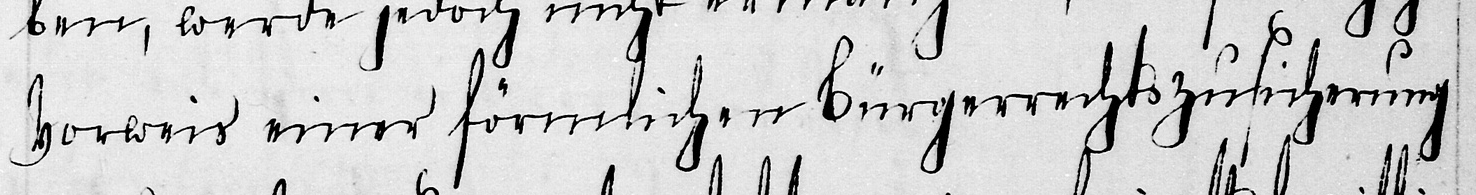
Vorweis einer förmlichen Bürgerrechtszusicherung
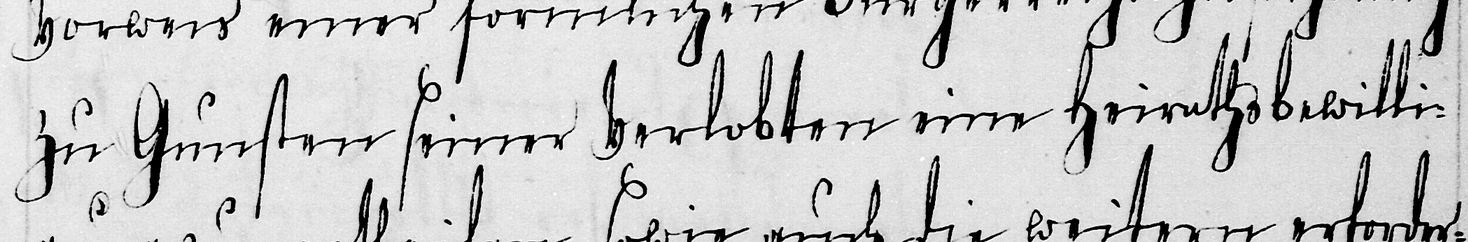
zu Gunsten seiner Verlobten eine Heirathsbewilli¬
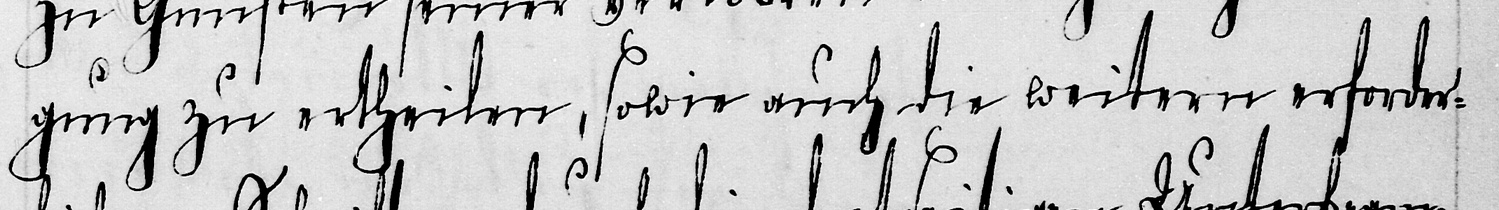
gung zu ertheilen, sowie auch die weitern erforder¬
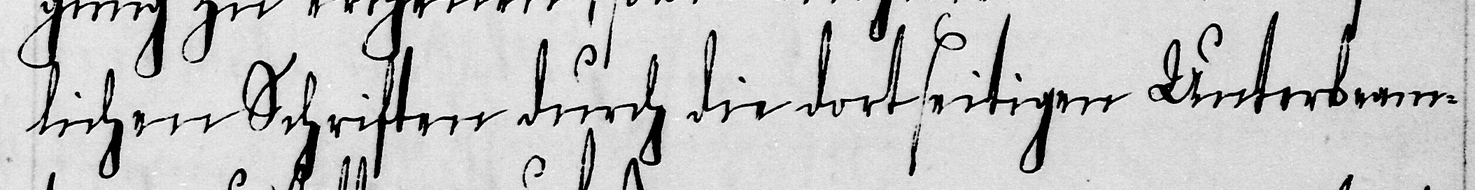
lichen Schriften durch die dortseitigen Unterbeam¬
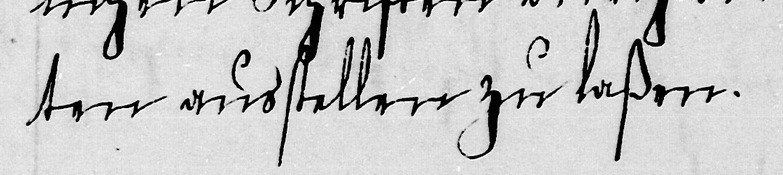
ten ausstellen zu laßen
